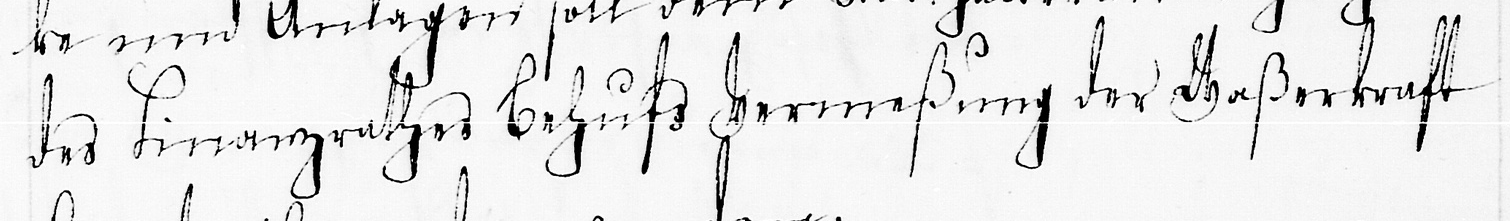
des Finanzrathes Behufs Vermeßung der Waßerkraft
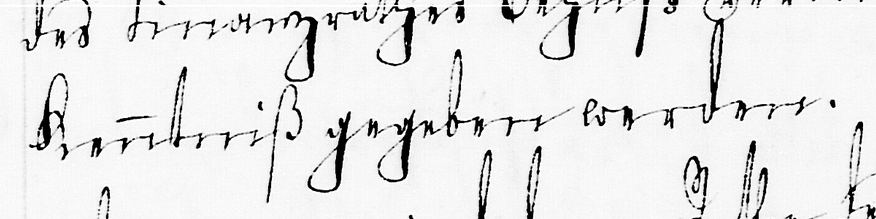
Kenntniß gegeben werden.
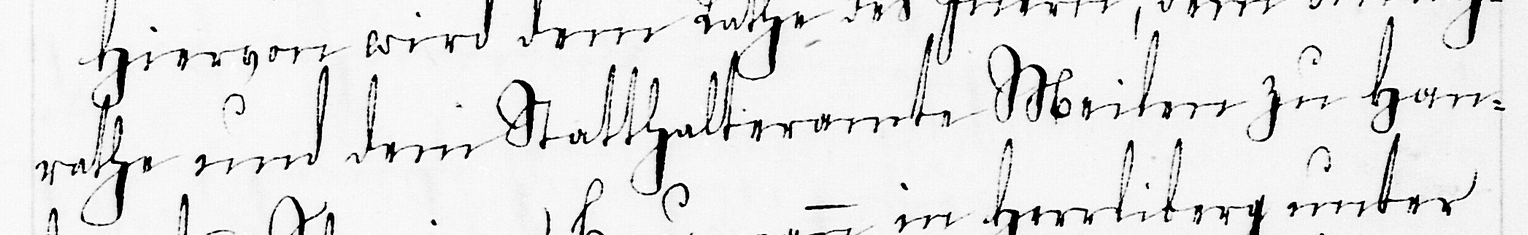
rathe und dem Statthalteramte Meilen zu Han¬
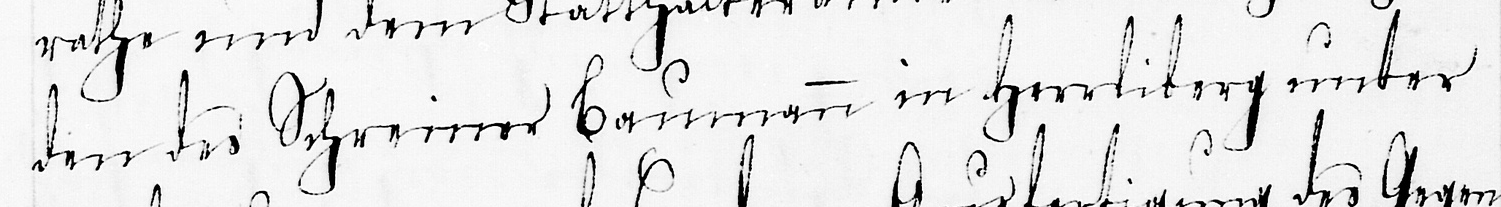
den des Schreiner Baumann in Herrliberg unter
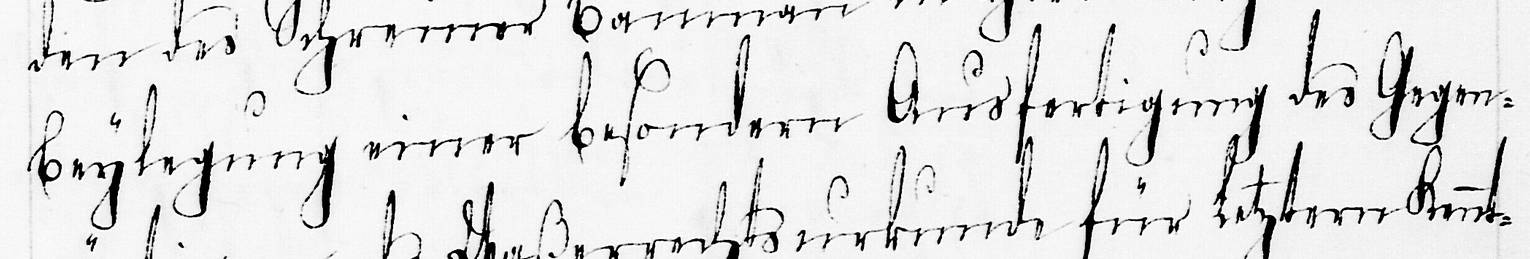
Beylegung einer besondern Ausfertigung des Gegen¬
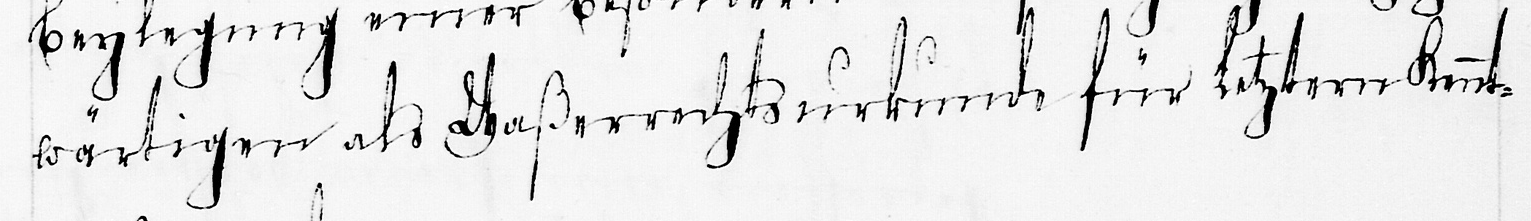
wärtigen als Waßerrechtsurkunde für Letztern Kennt¬
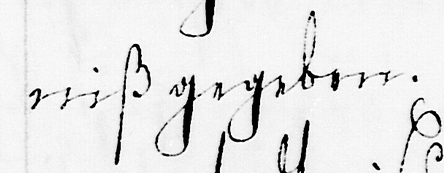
niß gegeben.
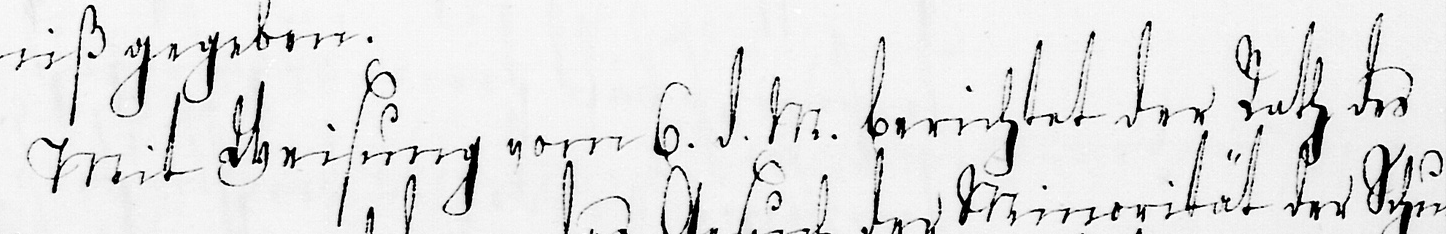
Mit Weisung vom 6. d. M. berichtet der Rath des
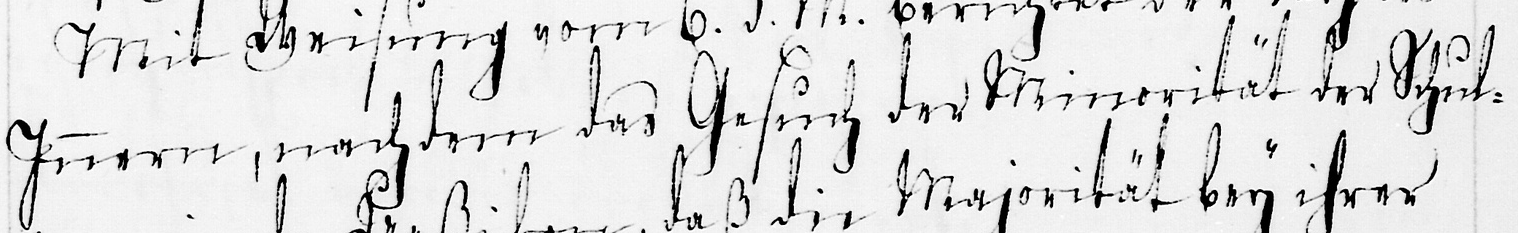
Innern, nachdem das Gesuch der Minorität der Schul¬
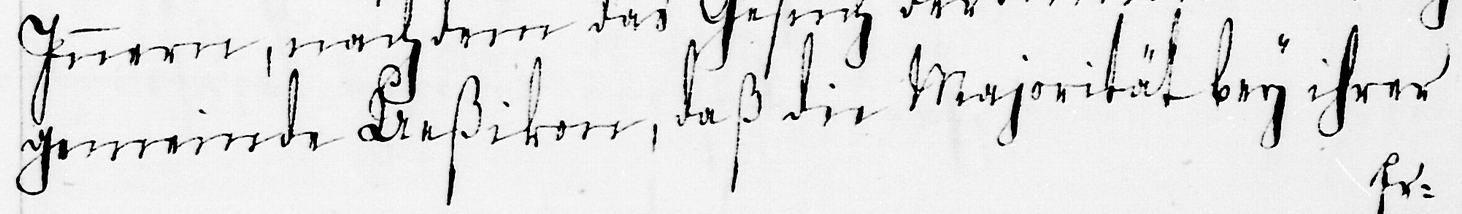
gemeinde Ueßikon, daß die Majorität bey ihrer
